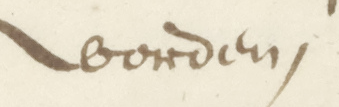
worden.
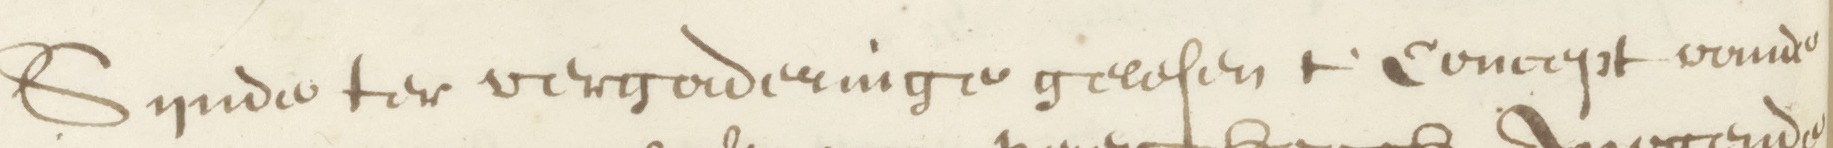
Synde ter vergaderinge gelesen t‛ Concept vande
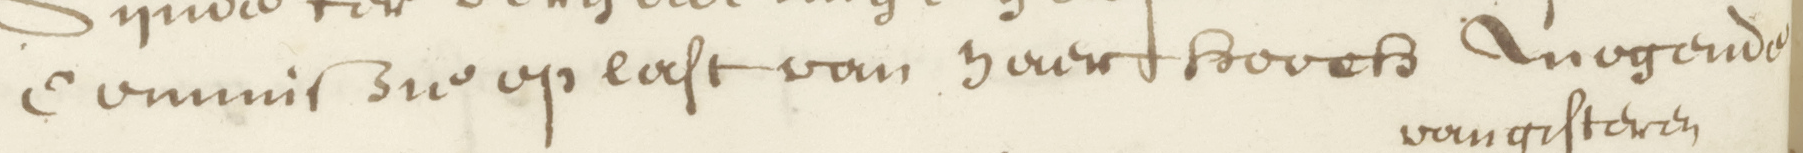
Commissie op last van haer Hooch Mogende
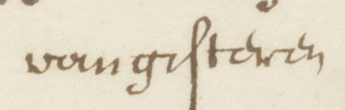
van gisteren
